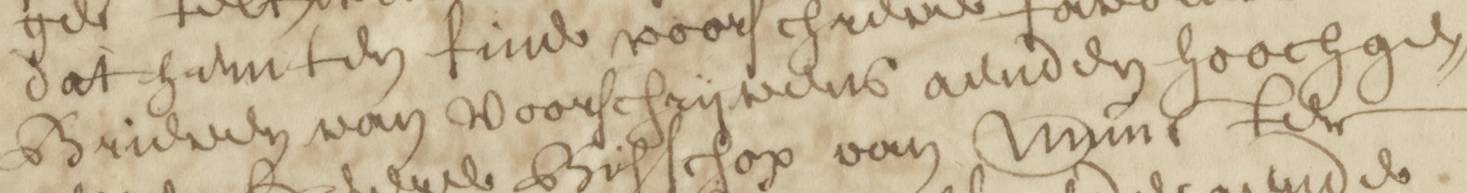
Brieven van Voorschrijvens aenden hoochge„
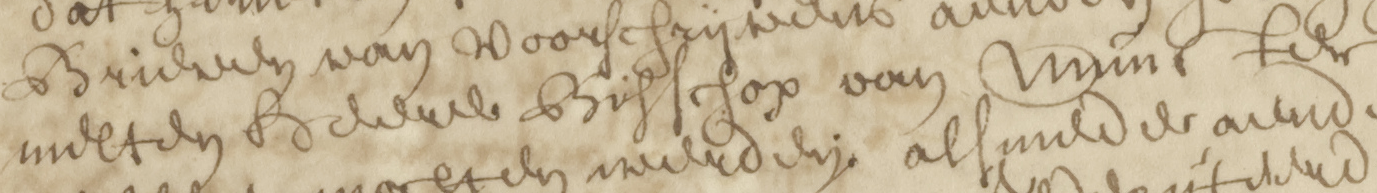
melten Heere Bisschop van Munster
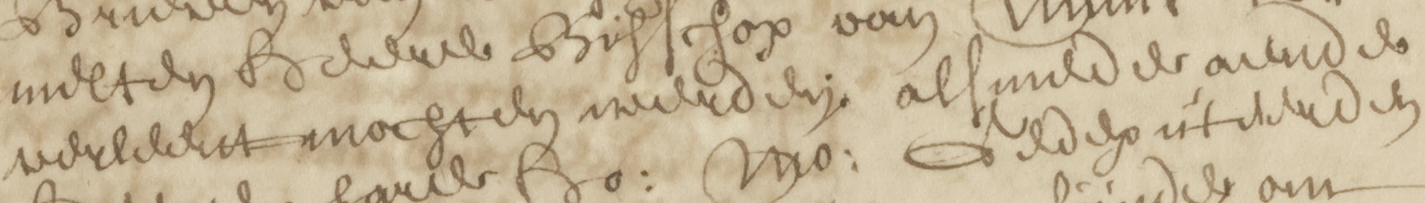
verleent mochten werden alsmede aende
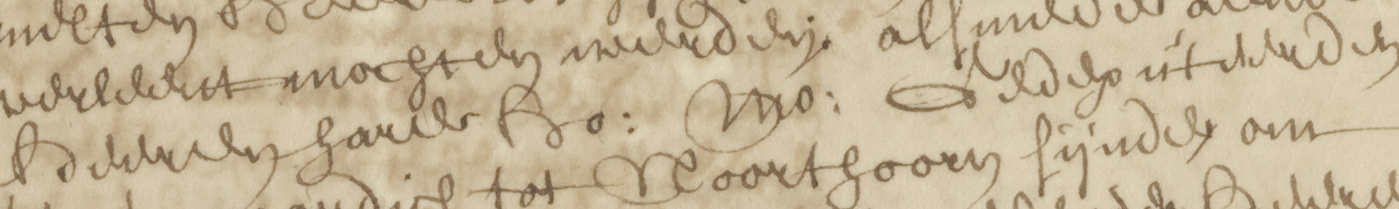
Heeren hare Ho:Mo: Gedeputeerden
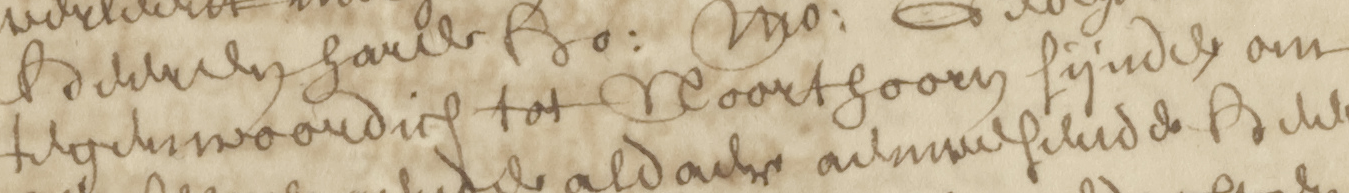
tegenwoordich tot Noorthoorn sijnde, om
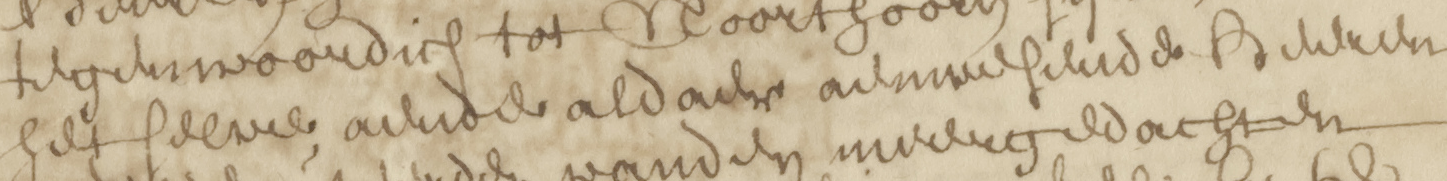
het selve aende aldaer aenwesende Heeren
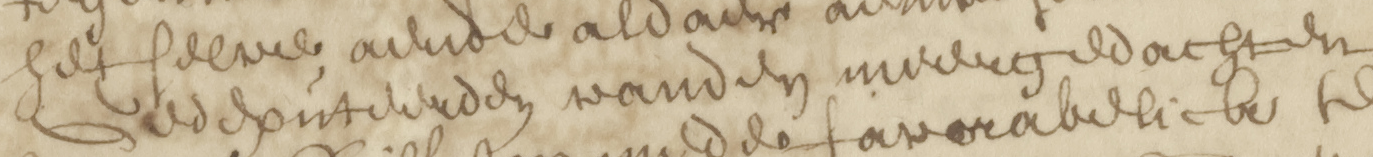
Gedeputeerden vanden meergedachten
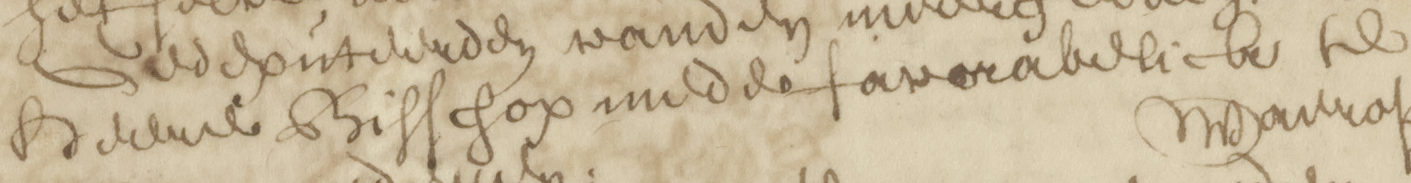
Heere Bisschop mede favorabelick te
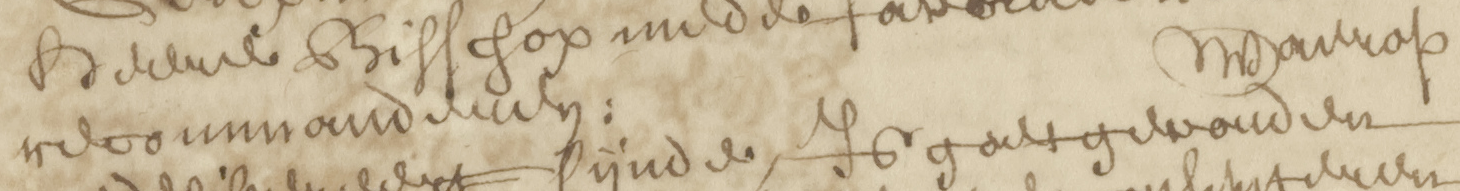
recommanderen: Waerop
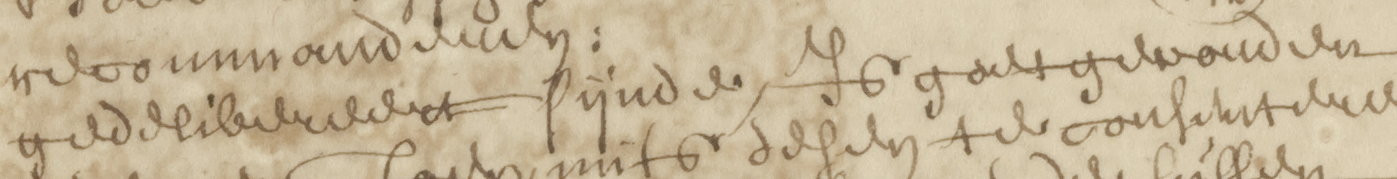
gedelibereert sijnde, Is goetgevonden
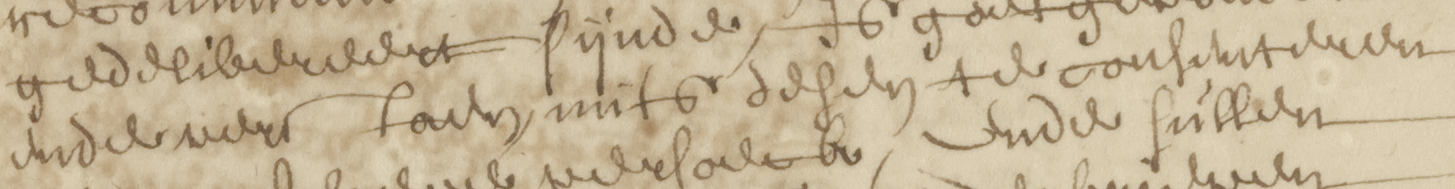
ende verstaen, mits desen te consenteren
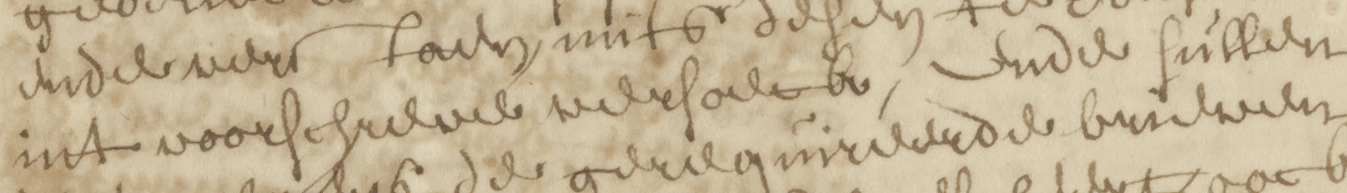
int voorschreve versoeck. Ende sullen
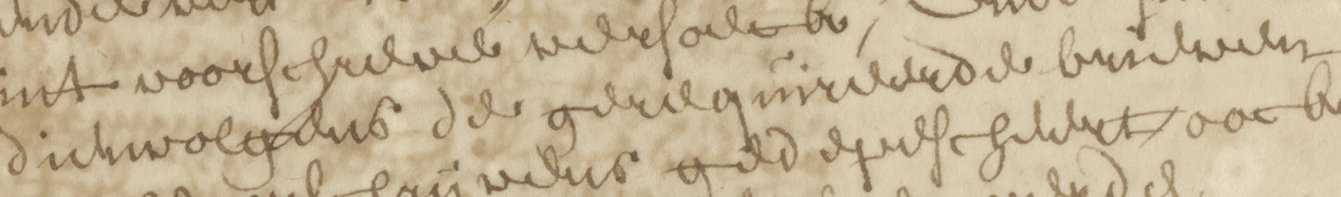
dienvolgens de gerequireerde brieven
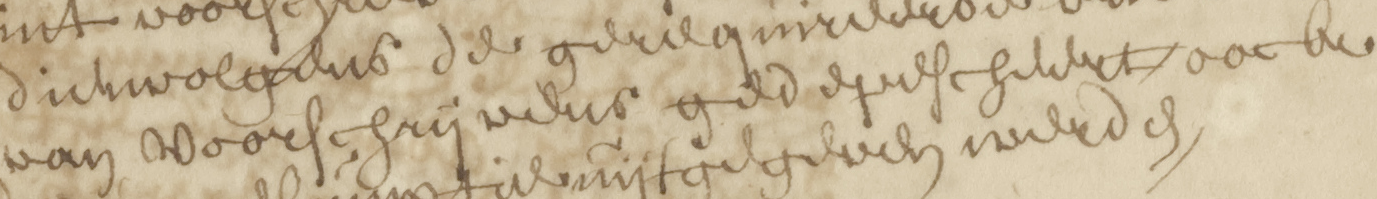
van Voorschrijvens gedepescheert, oock
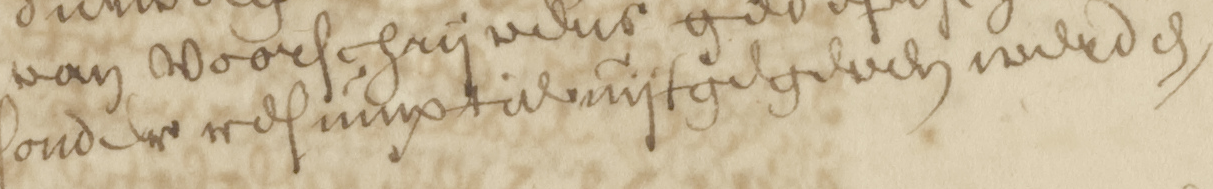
sonder resumptie uijtgegeven werden.
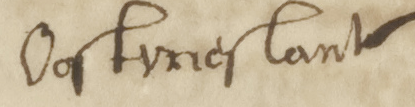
Oostvrieslant
